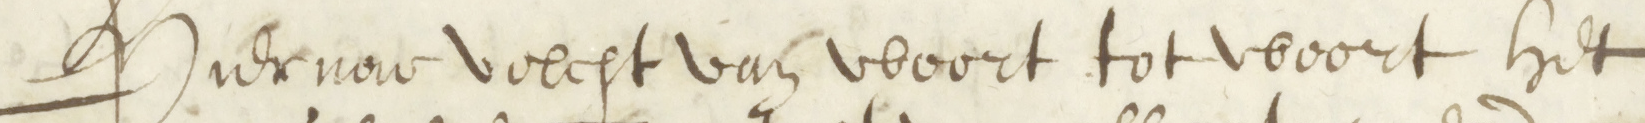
Hiernae volcht van woort tot woort het
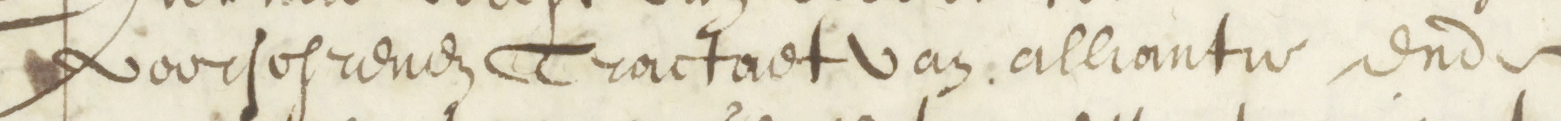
voorschreuen Tractaet van alliantie ende
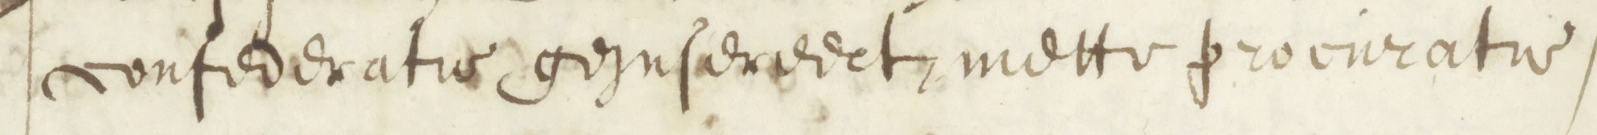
confederatie geinsereert, mette procuratie.
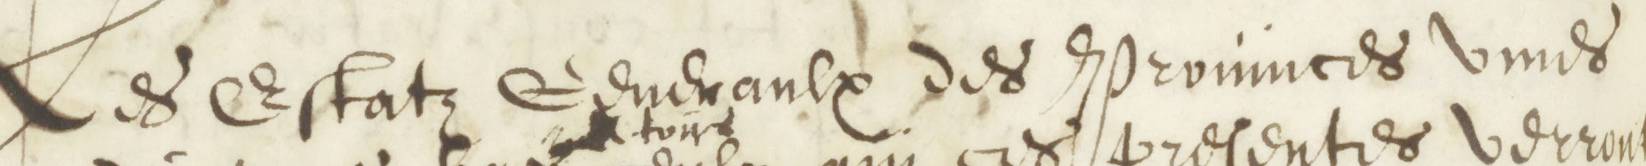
Les Estatz Generaulx des Prouinces viues
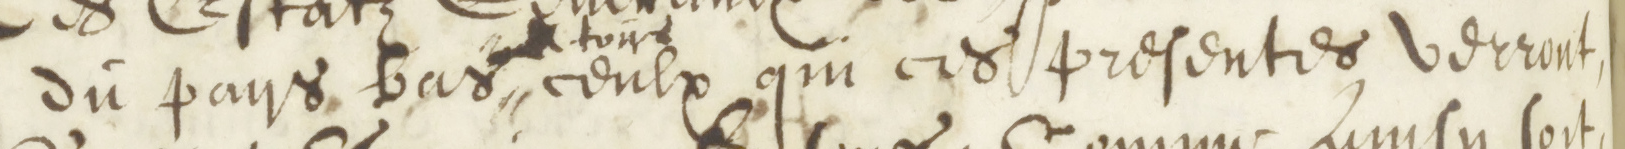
du pays bas "A tous ceulx qui ces presentes verront,
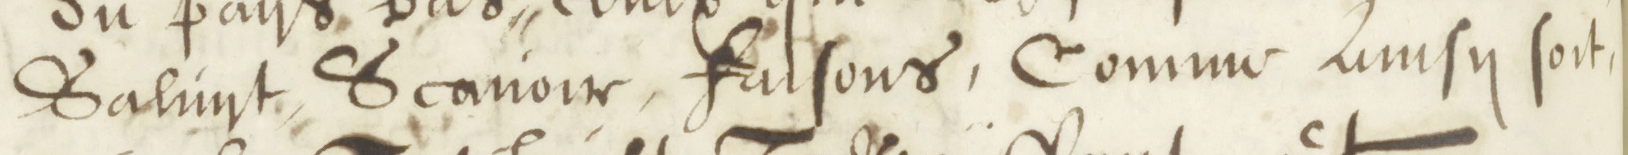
Saluyt, Scauoir, Faisons. Comme ainsy soit,
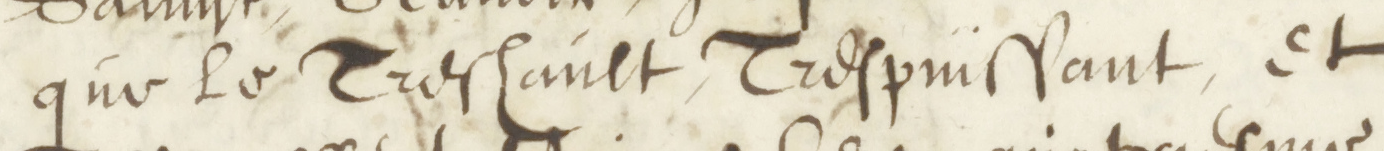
que le Treshault, Trespuissant, et
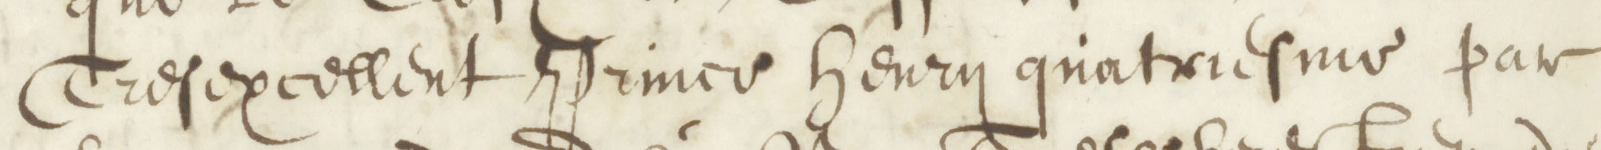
Tresexcellent Prince henry quatriesme par
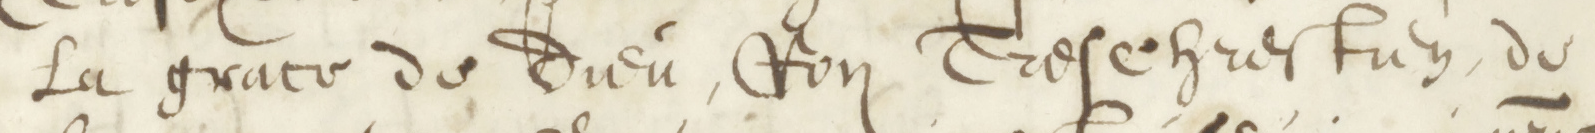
la grace de Dieu, Roy Tres chrestien, de
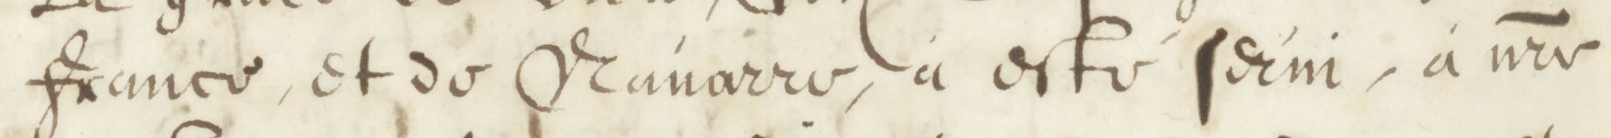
France, et de Nauarre, a esté serui, a nre
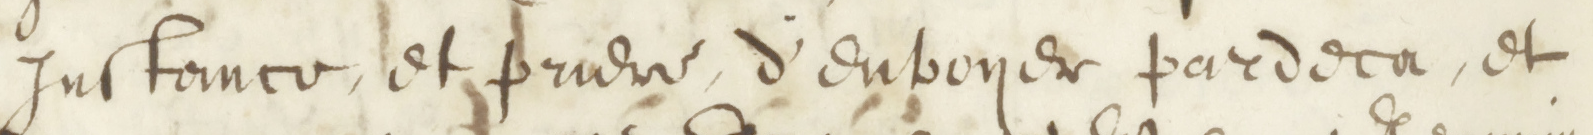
Instance, et priere, d‛envoyer par deca, et
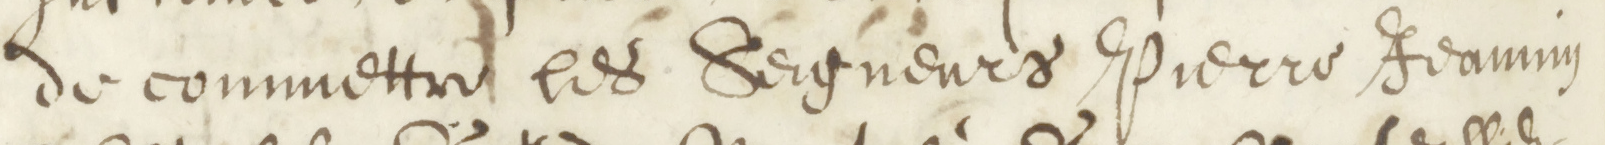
de commettre les Seigneurs Pierre Jeannin
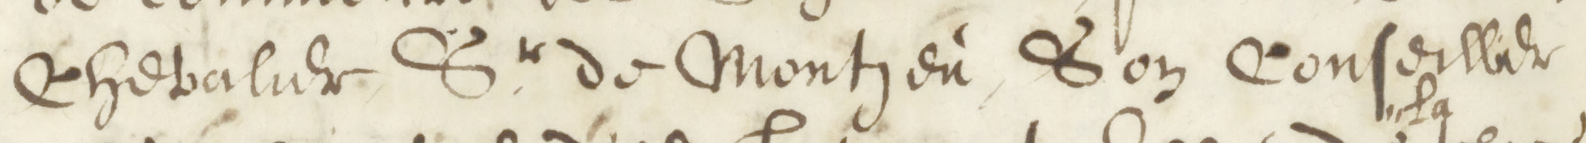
Chevalier Sr. de Montjeu, Son Conseiller
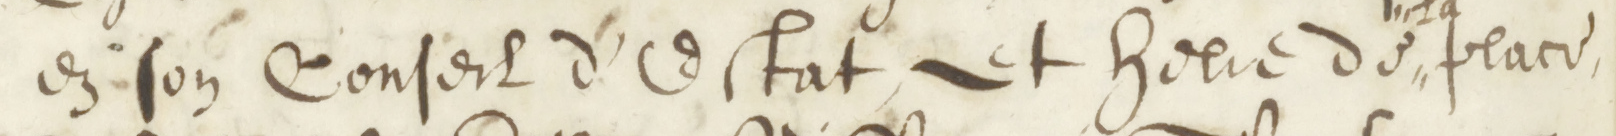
en son Conseil d'Estat et helie de ''la place,
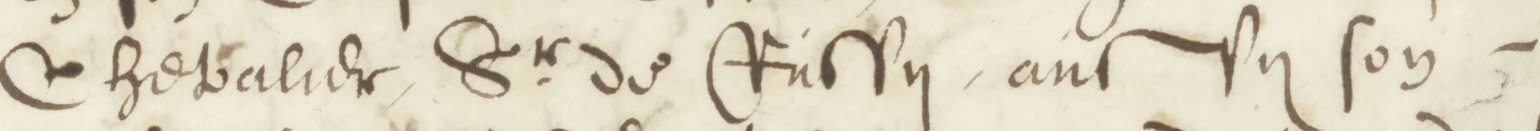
Chevalier Sr. de Russy, aussy son —
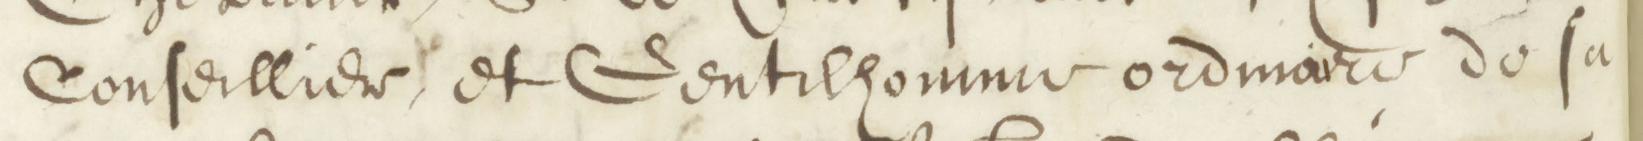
Conseillier, et Gentilhomme ordinaire de sa
